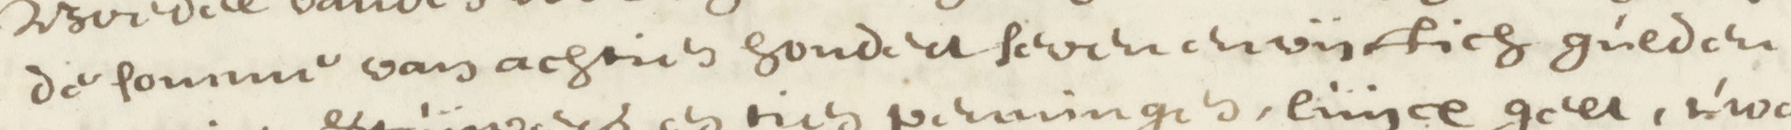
de somme van achtien hondert sevenenvijftich gulden
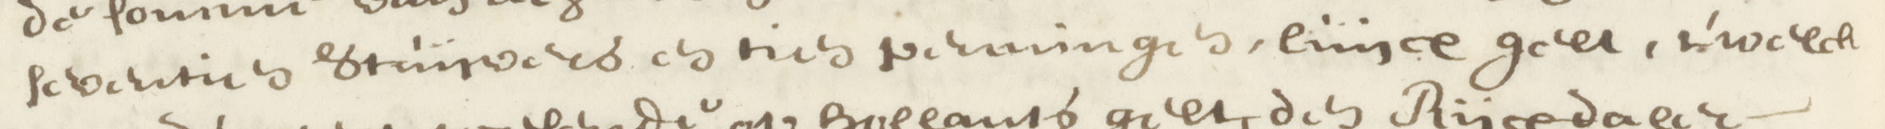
seventien stuijvers en tien penningen, luijcx gelt, t'welck
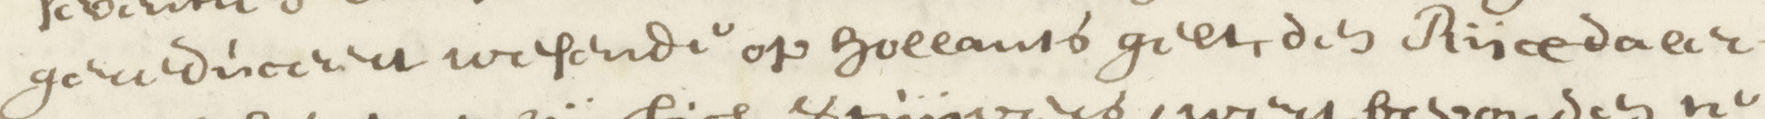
gereduceert wesende op hollants gelt, den Rijcxdaler
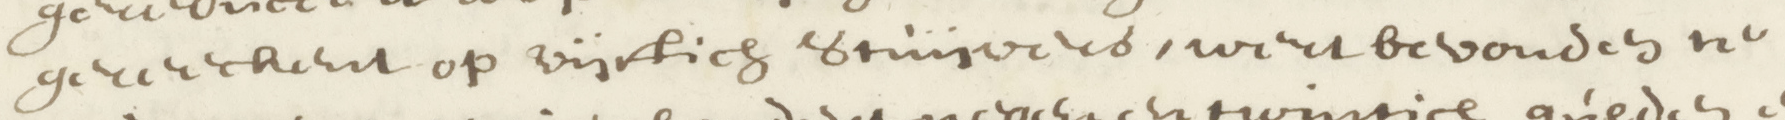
gereeckent op vijftich stuijvers, wert bevonden te
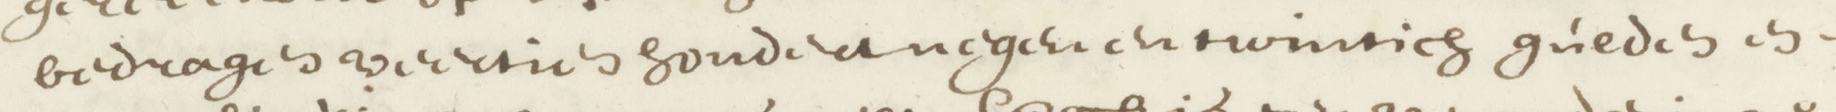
bedragen veertien hondert negenentwintich gulden en
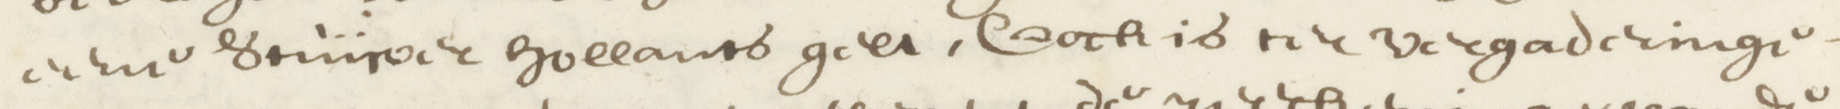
eene Stuijver hollants gelt. Oock is ter vergaderinge
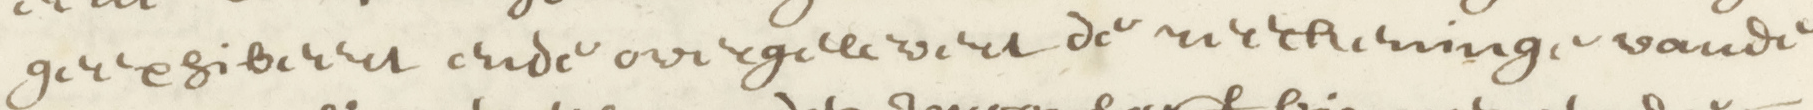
geexhibeert ende overgelevert de reeckeninge vande
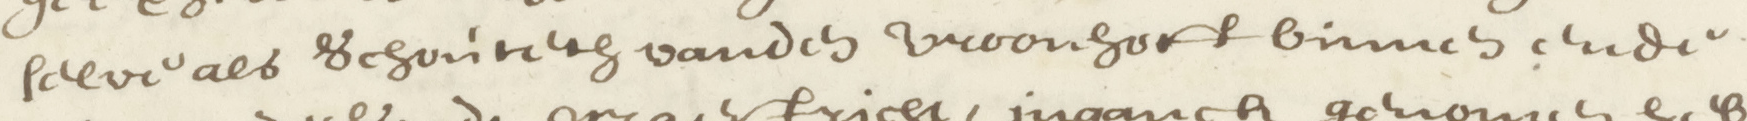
selve als Schouteth vanden vroonhoff binnen ende
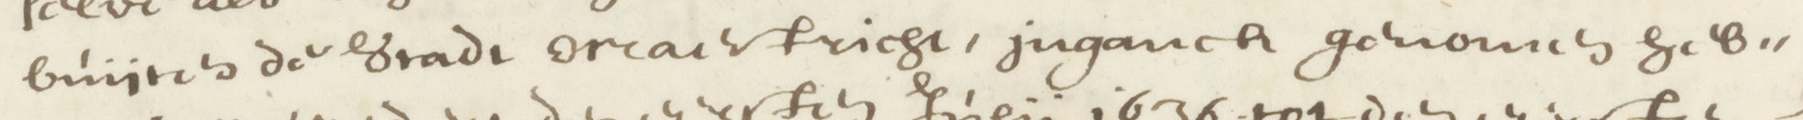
buijten de Stadt Maestricht, inganck genomen heb„
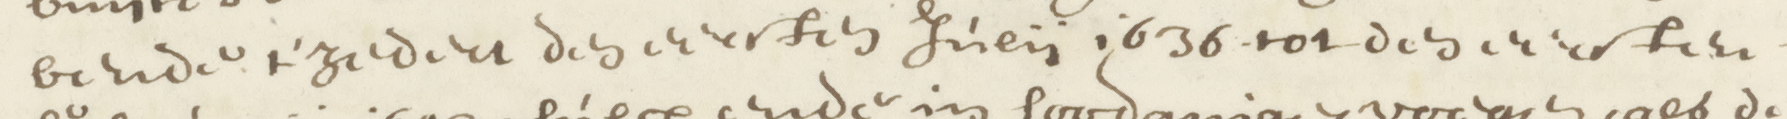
bende t'zedert den eersten Julij 1636 tot den eersten
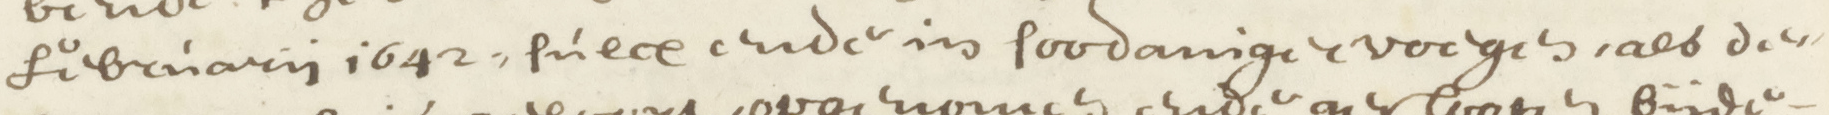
februarij 1642, sulcx ende in soodaniger voegen als de,,
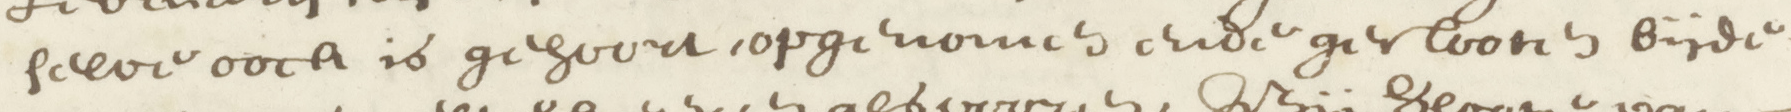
selve oock is gehoort, opgenomen ende geslooten bijde
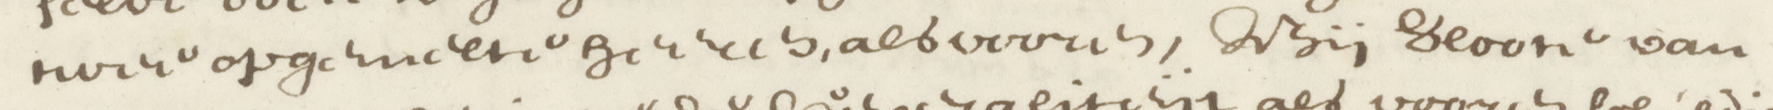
twee opgemelte heere als vooren. Bij sloote van
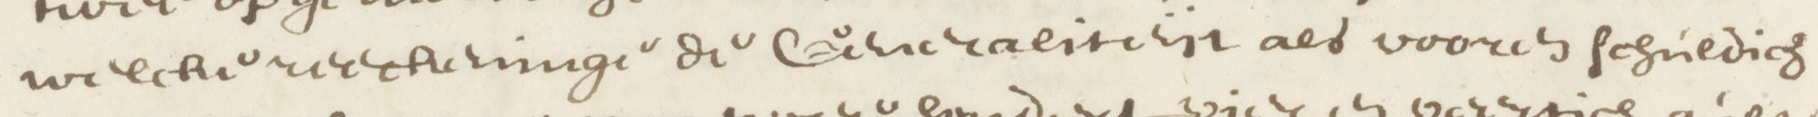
welcke reeckeninge de Generaliteijt als vooren schuldich
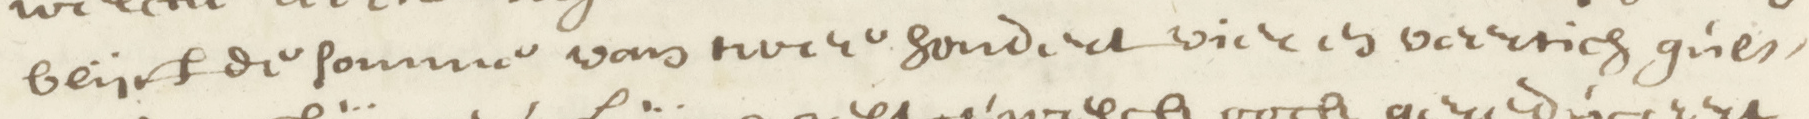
blijft de somme van twee hondert vier en veertich guls.
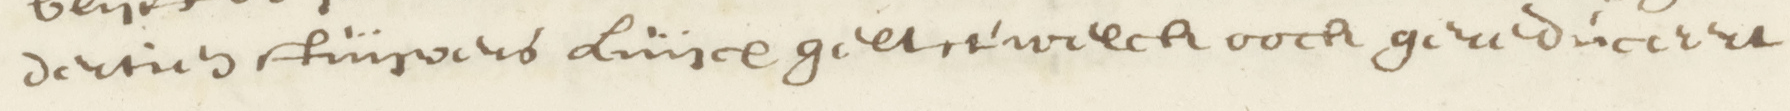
dertien stuijvers Luijcx gelt t'welck oock gereduceert
